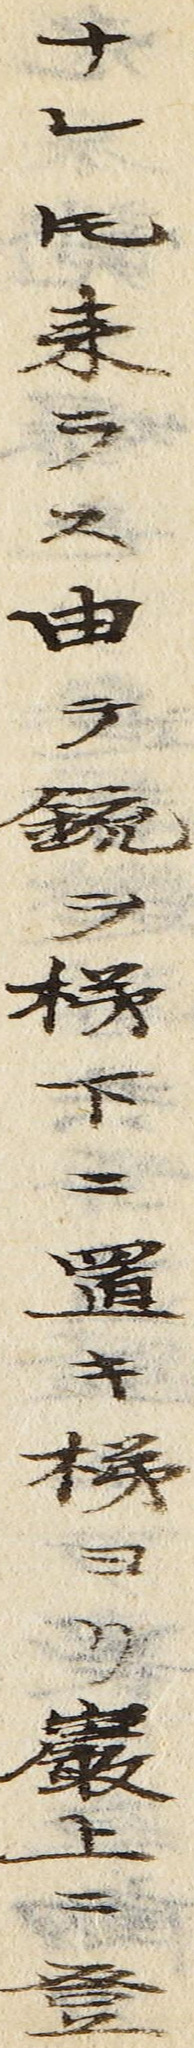ナレトモ来ラス由テ銃ヲ梯下ニ置キ梯ヨリ巌上ニ登
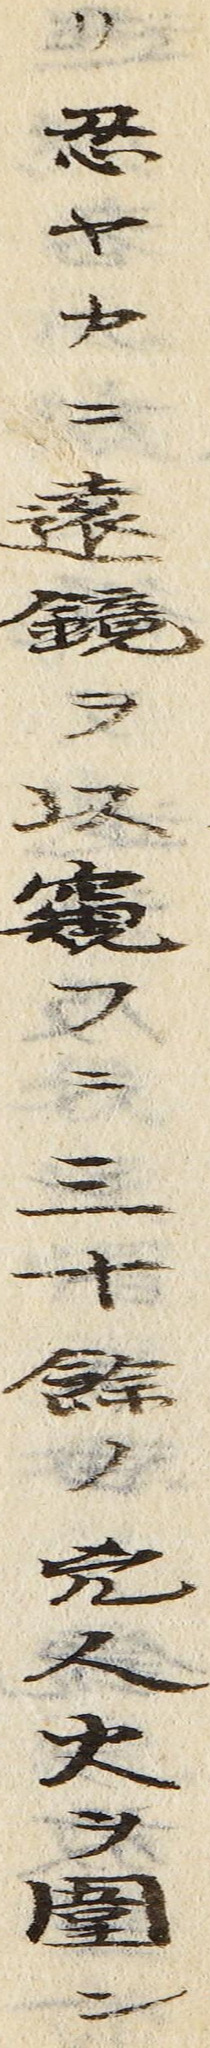リ忍ヤカニ遠鏡ヲ以窺フニ三十余ノ兇人火ヲ囲ン
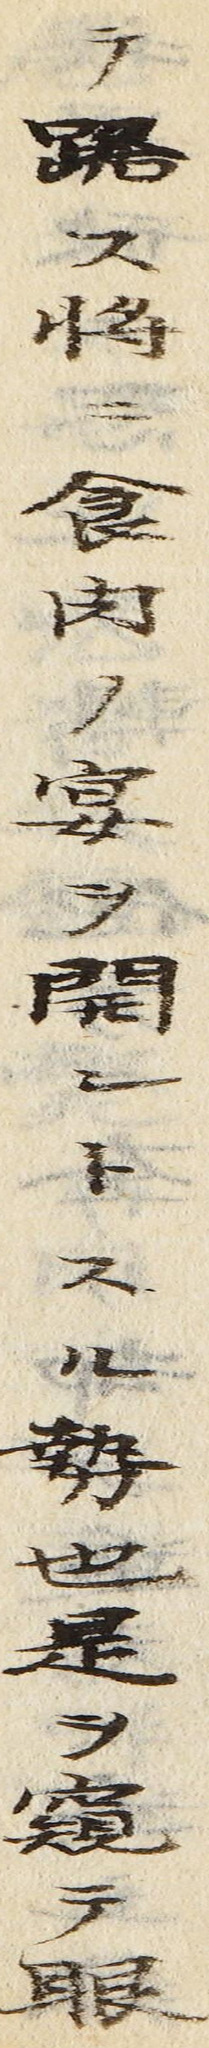テ踞ス将ニ食肉ノ宴ヲ開ントスル勢也是ヲ窺テ眼
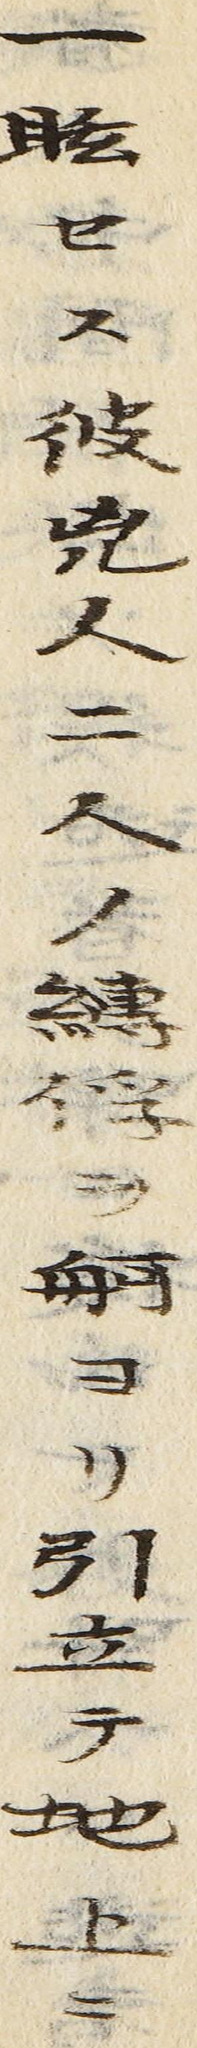一眩セス彼兇人二人ノ縛俘ヲ舸ヨリ引立テ地上ニ
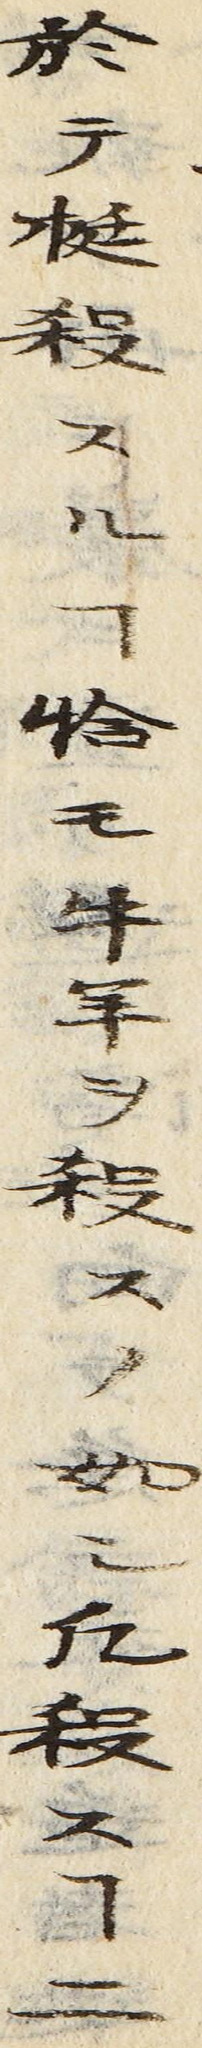於テ梃殺スルコト恰モ牛羊ヲ殺スノ如シ凡殺スコト二
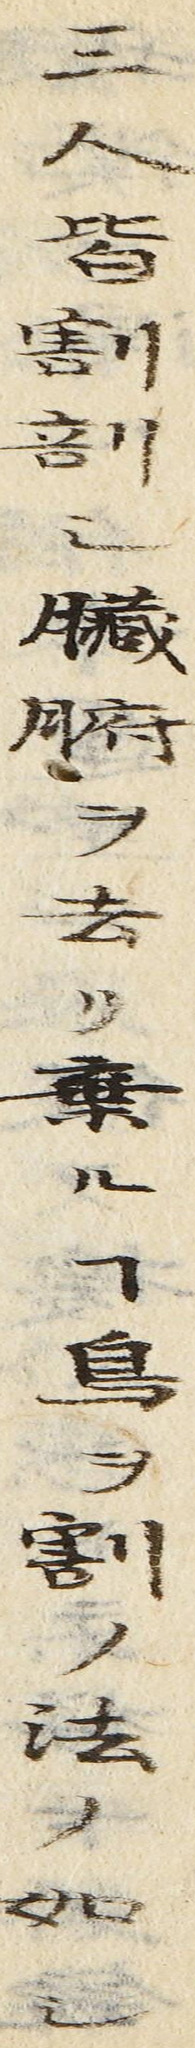三人皆割剖シ臓腑ヲ去リ棄ルコト鳥ヲ割ノ法ノ如シ
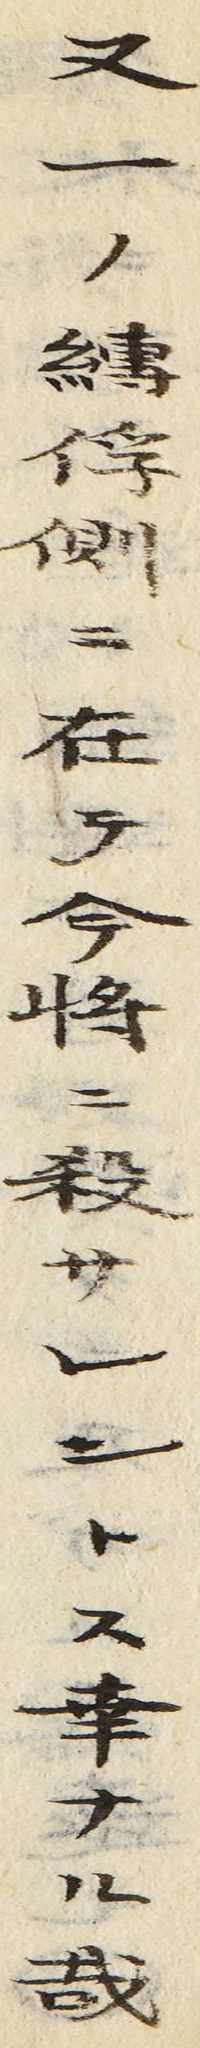又一ノ縛俘側ニ在テ今将ニ殺サレントス幸ナル哉
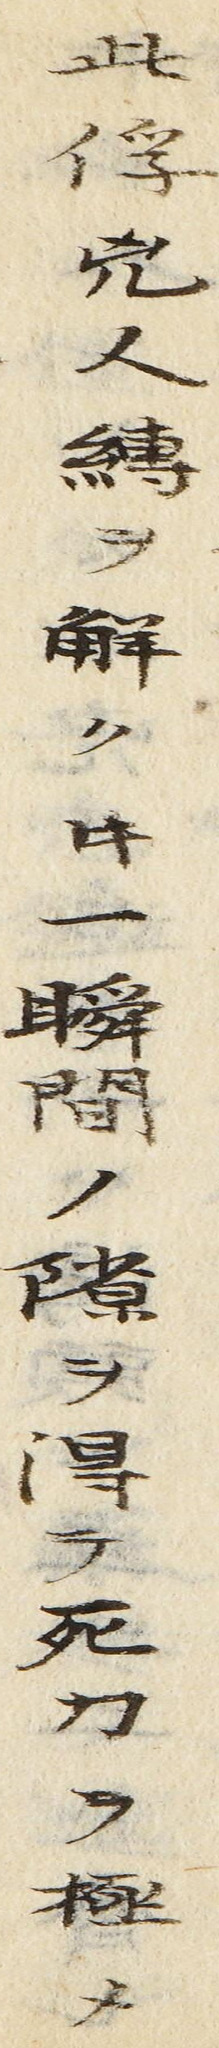此俘兇人縛ヲ解クトキ一瞬間ノ隙ヲ得テ死力ヲ極メ
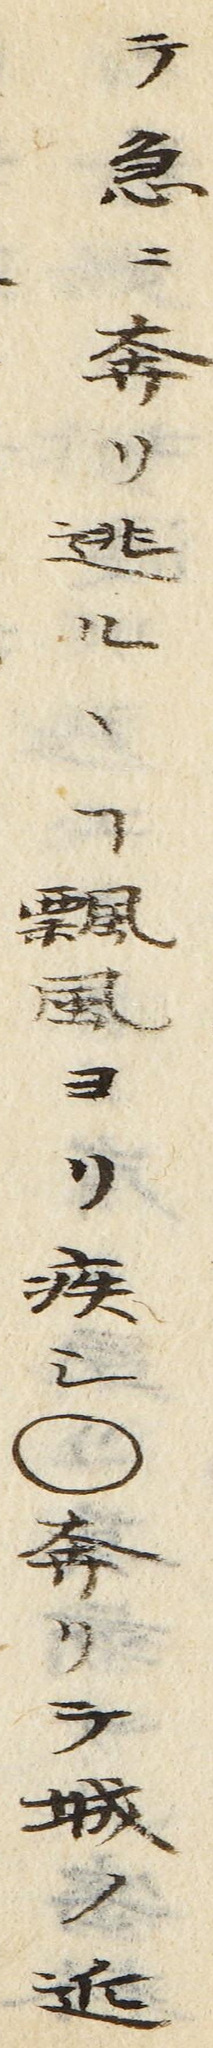テ急ニ奔リ逃ルヽコト飄風ヨリ疾シ◯奔リテ城ノ近
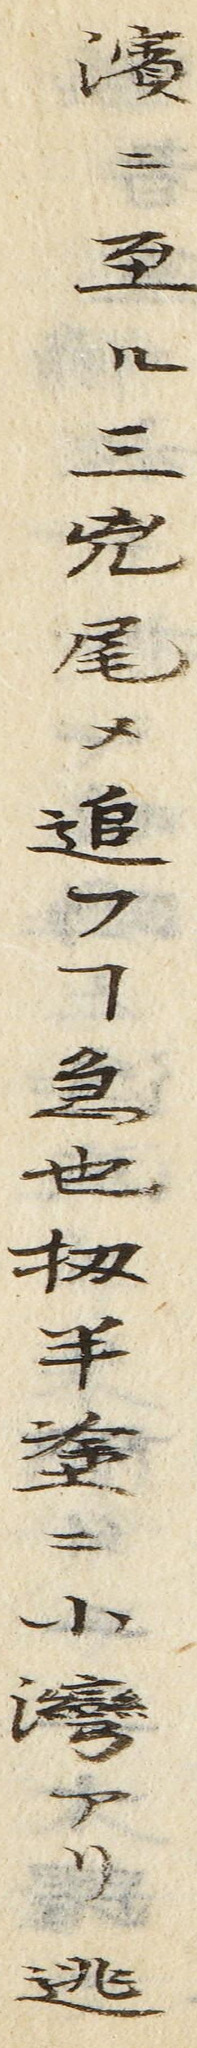浜ニ至ル三兇尾シテ追フコト急也扨半塗ニ小湾アリ逃

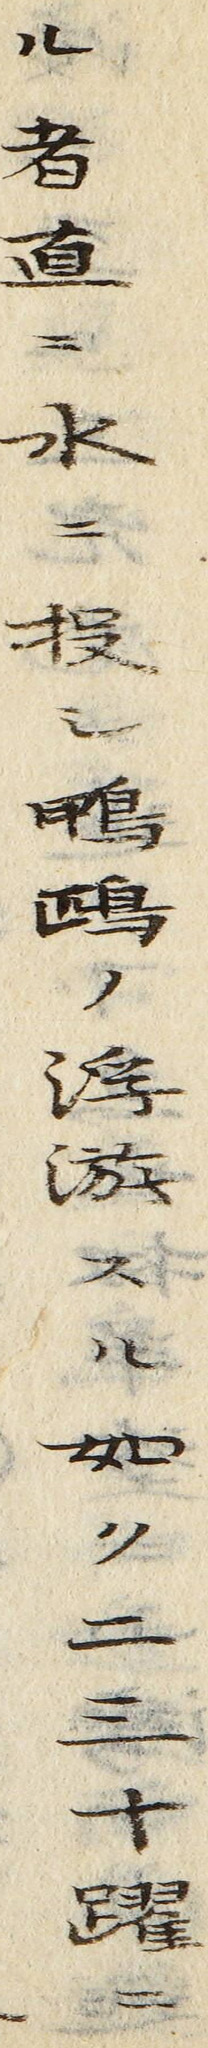ル者直ニ水ニ投シ鴨鴄ノ浮游スル如ク二三十躍ニ
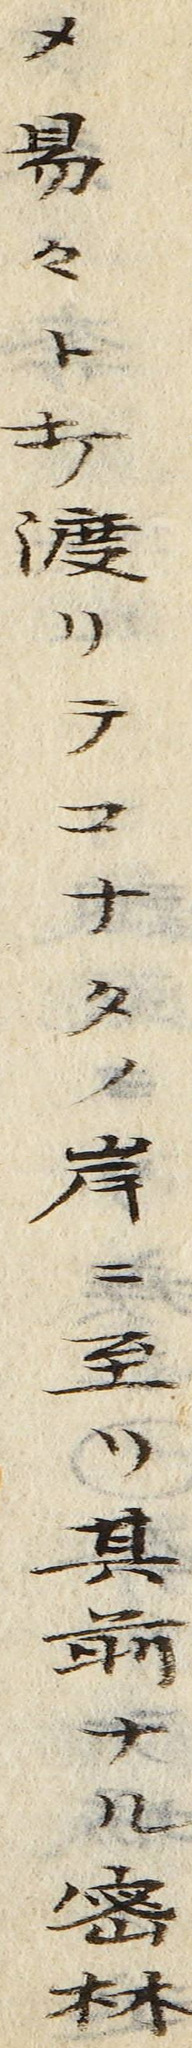シテ易々ト打渡リテコナタノ岸ニ至リ其前ナル密林
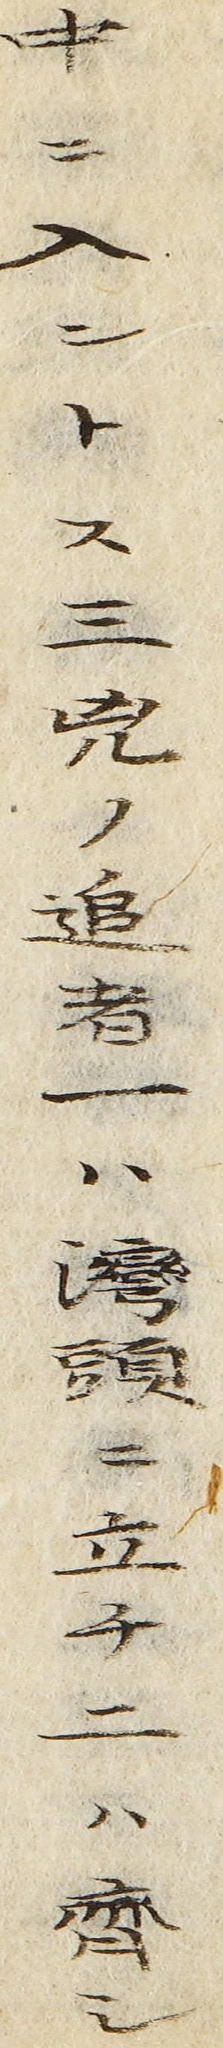中ニ入ントス三兇ノ追者一ハ湾頭ニ立チ二ハ斉シ
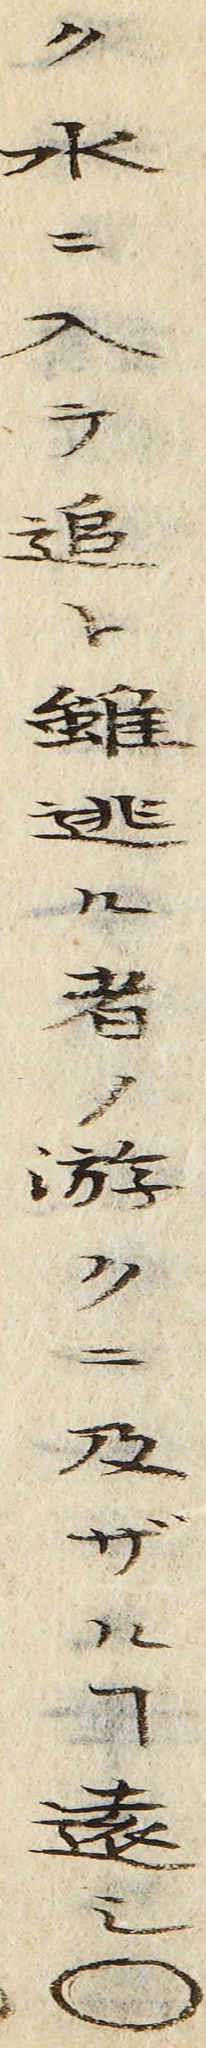ク水ニ入テ追ト雖逃ル者ノ游クニ及ザルコト遠シ◯
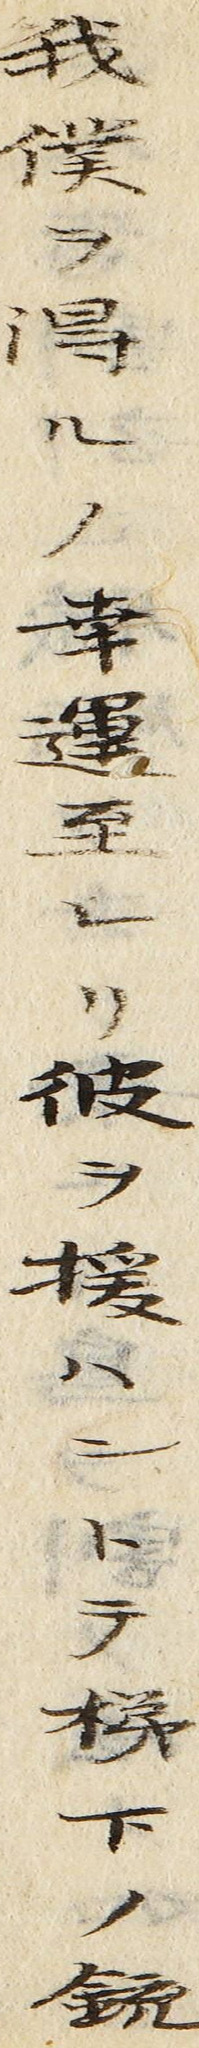我僕ヲ得ルノ幸運至レリ彼ヲ援ハントテ梯下ノ銃
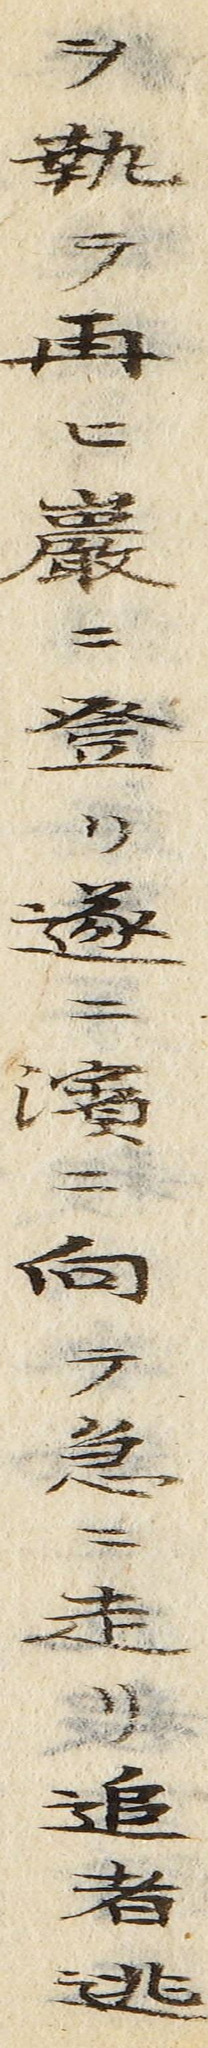ヲ執テ再ヒ巌ニ登リ遂ニ浜ニ向テ急ニ走リ追者逃
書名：漂流紀事
